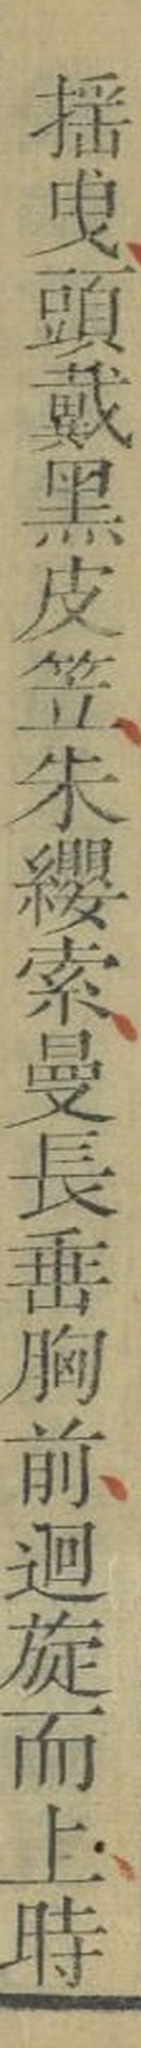揺拽頭戴黑皮笠朱纓索曼長垂胸前廻旋而上時
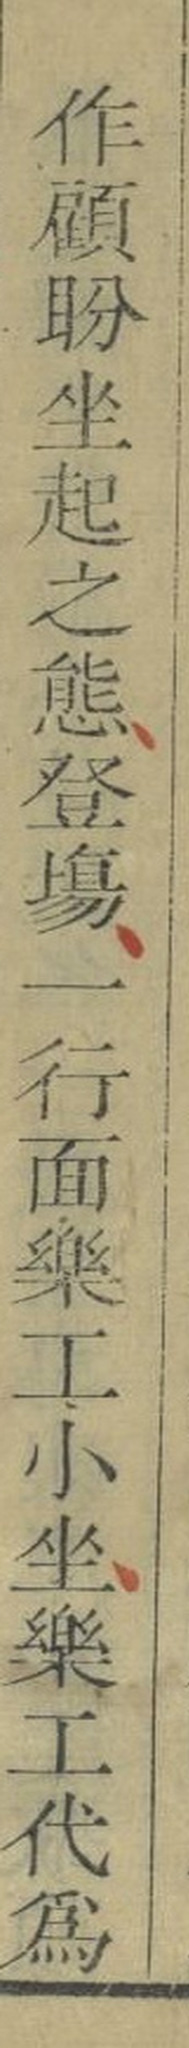作顧盼坐起之態登塲一行面樂工小坐樂工代爲
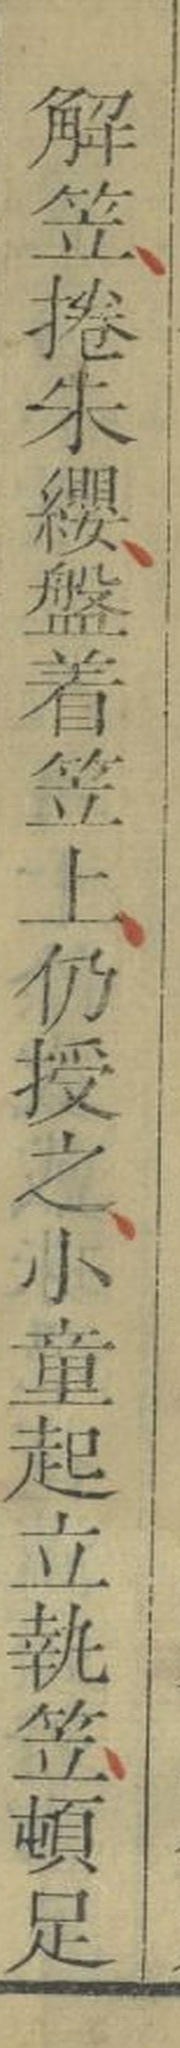解笠捲朱纓盤着笠上仍授之小童起立執笠頓足
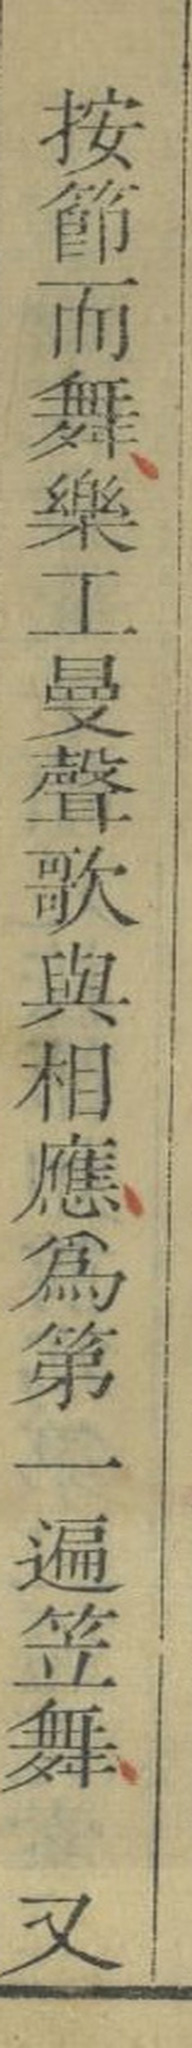按節而舞樂工曼聲歌與相應爲第一遍笠舞又
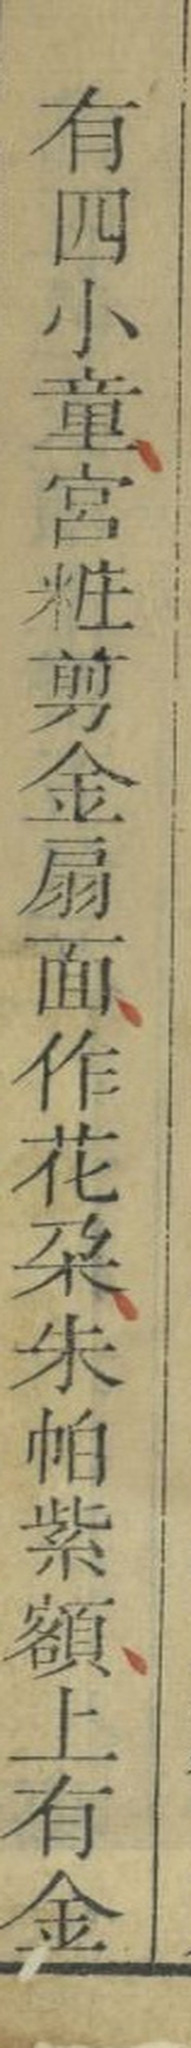有四小童宮粧剪金扇面作花朶朱帕紫額上有金

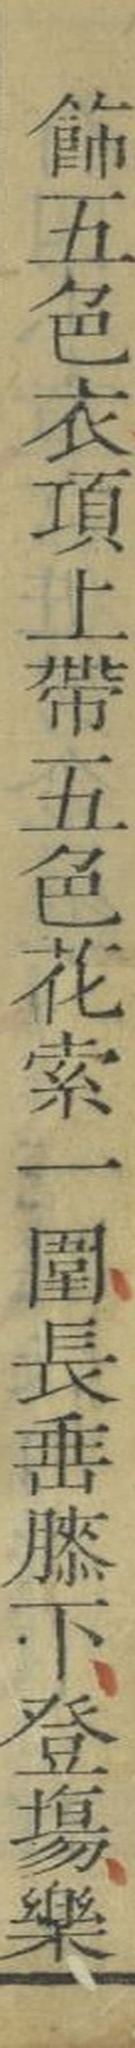飾五色衣項上帶五色花索一圍長垂膝下登塲樂
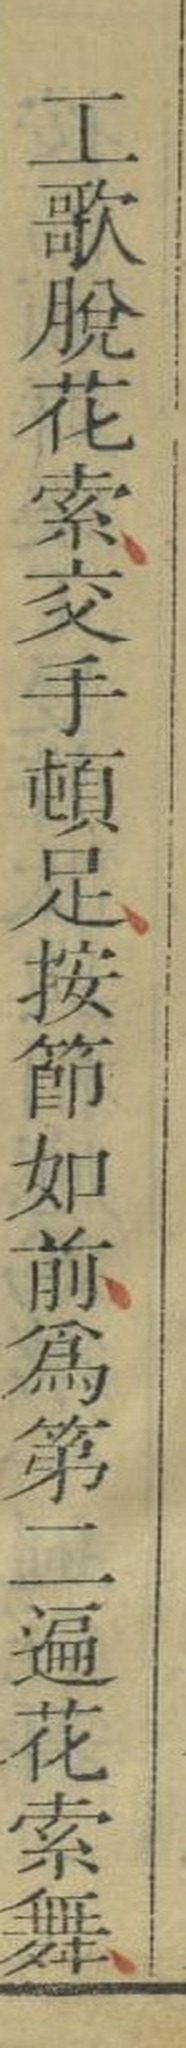工歌脱花索交手頓足按節如前爲第二遍花索舞
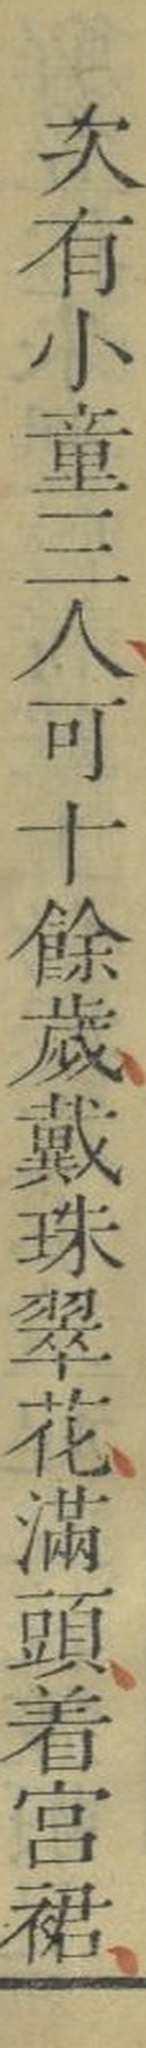次有小童三人可十餘歲戴珠翠花滿頭着宫裙
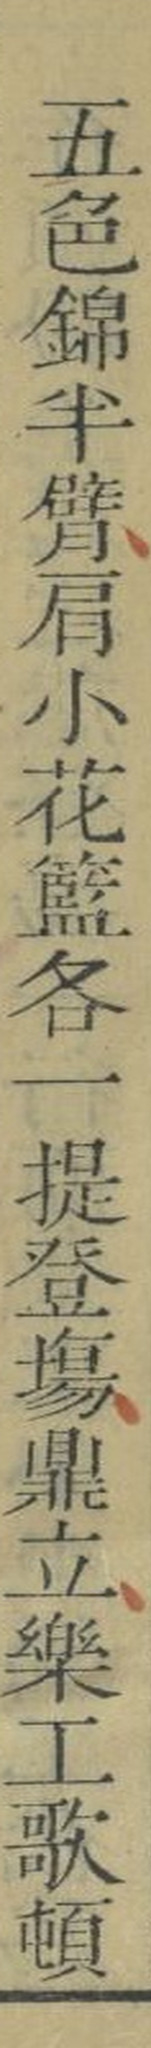五色錦半臂肩小花籃各一提登塲鼎立樂工歌頓
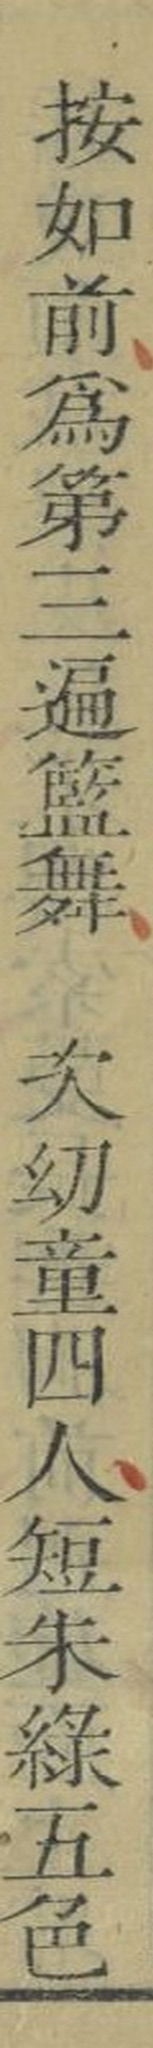按如前爲第三遍籃舞次幼童四人短朱綠五色
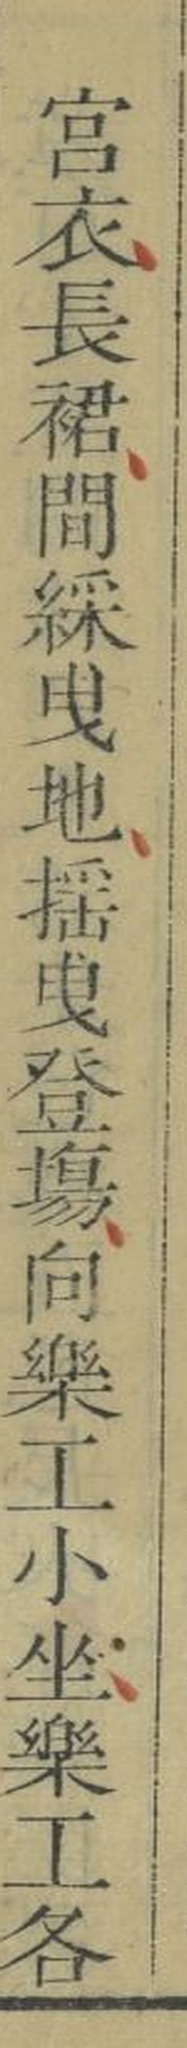宫衣長裙間綵拽地揺拽登塲向樂工小坐樂工各
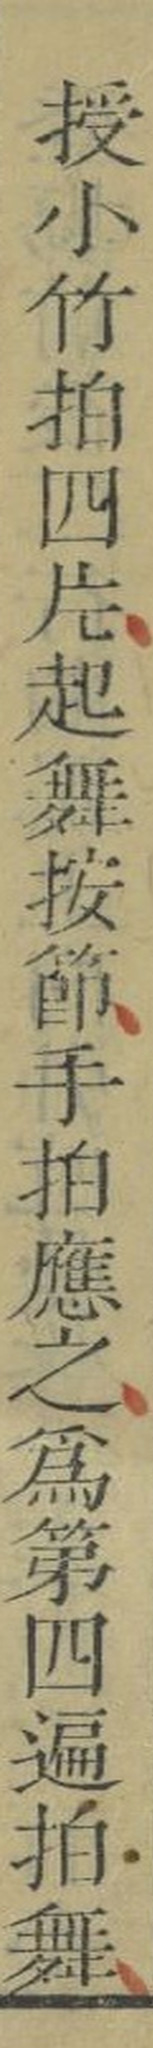授小竹拍四片起舞按節手拍應之爲第四遍拍舞
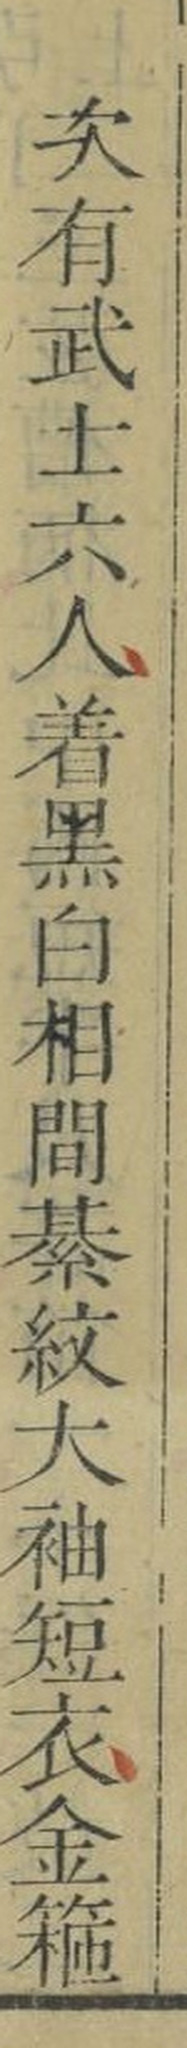次有武士六人着黑白相間綦紋大袖短衣金篐
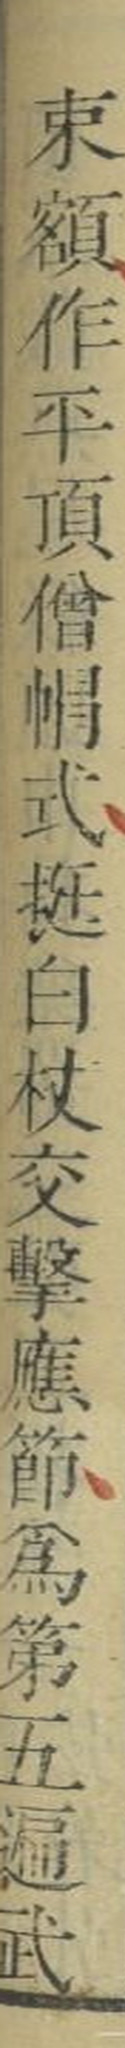束額作平頂僧帽式挺白杖交擊應節爲第五遍武
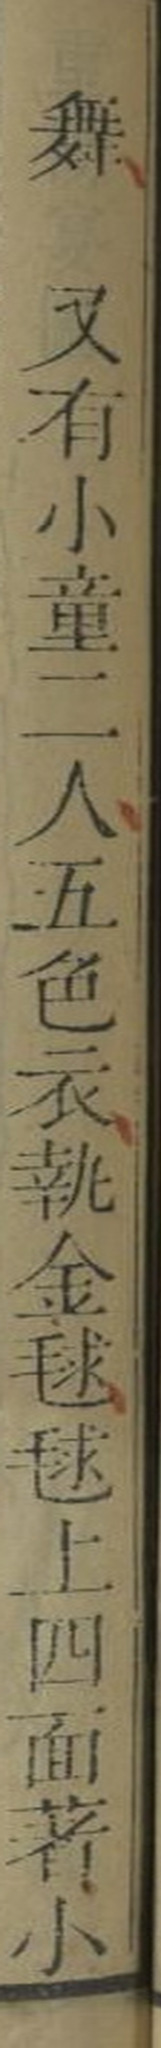舞又有小童二人五色衣執金毬毬上四面著小
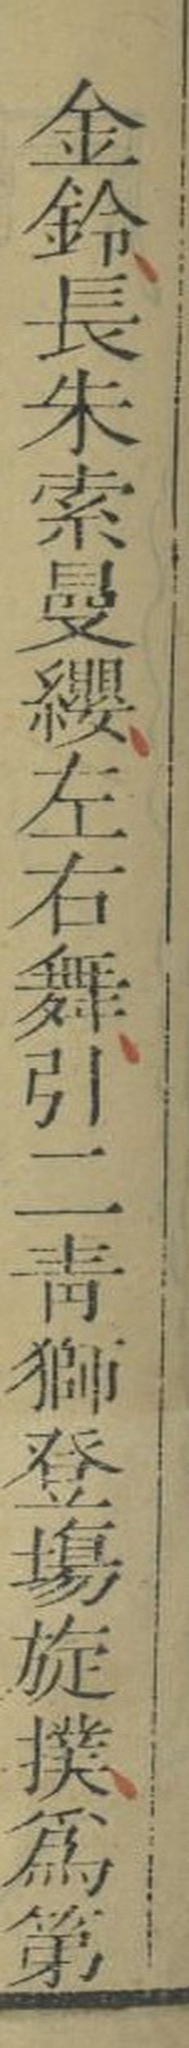金鈴長朱索曼纓左右舞引二靑獅登塲旋撲爲第
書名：中山伝信録 巻一、巻二
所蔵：University of the Ryukyus Library
